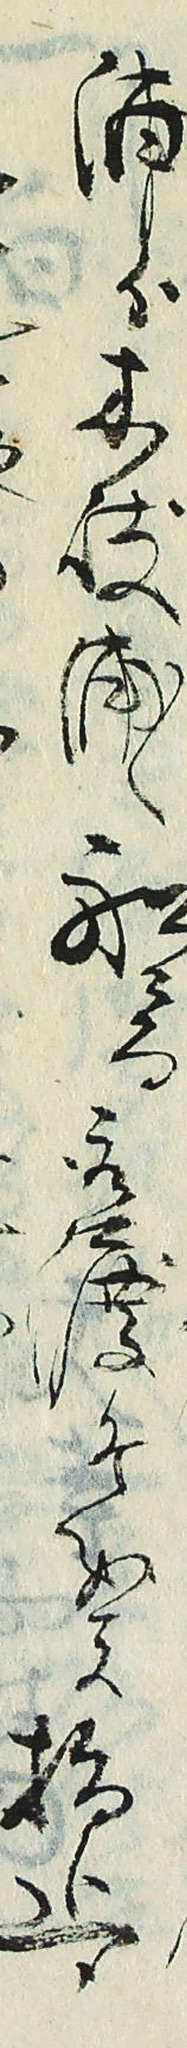浦ゟ木岐浦へ船にて取渡候義は指止め
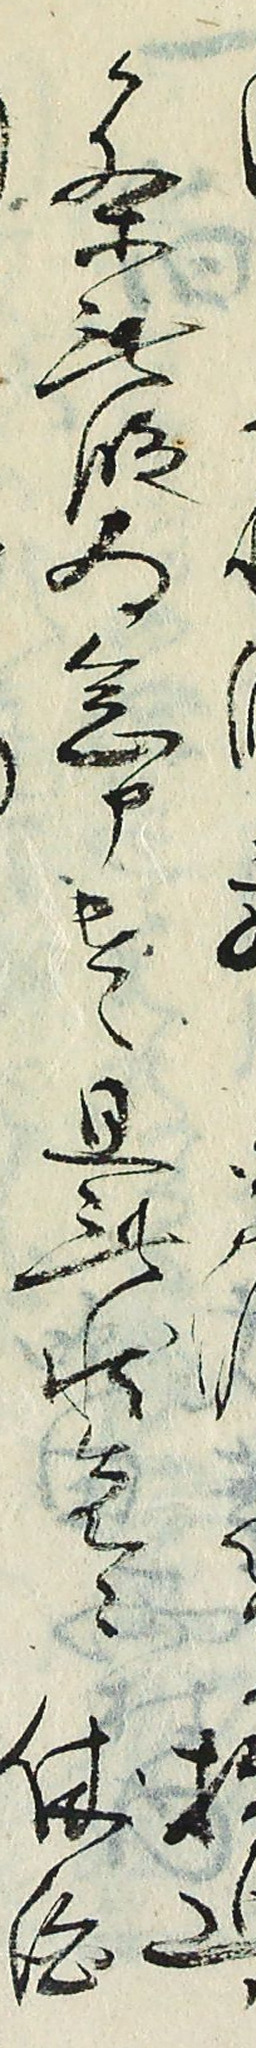候条此段為念申遣候且此状先々休泊
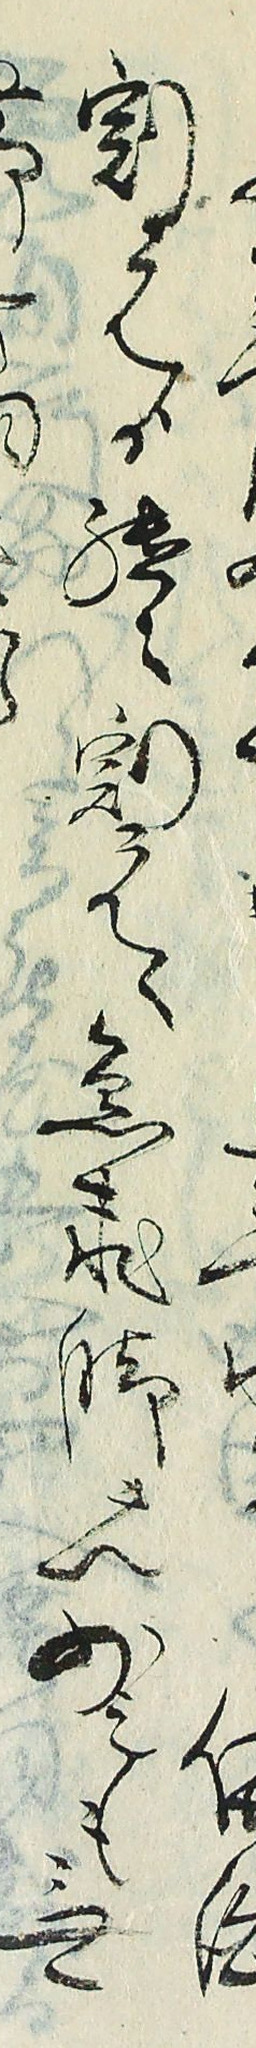割元ゟ継之割元へ急飛脚を以少しも無
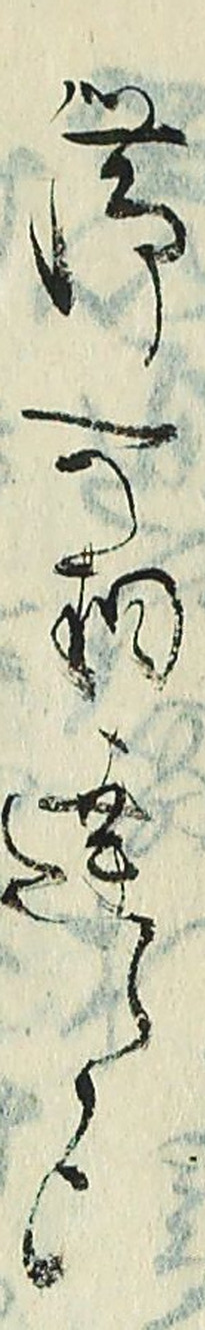滞可相達候以上
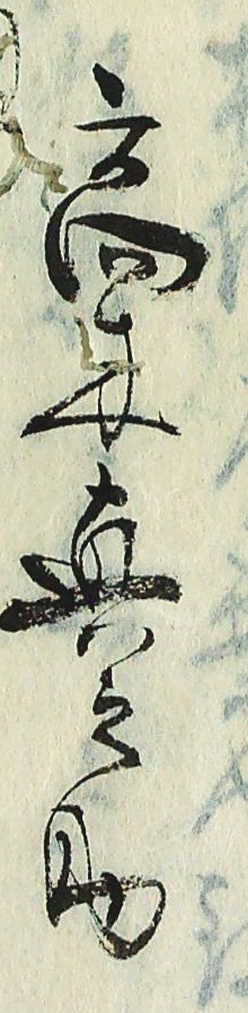高木真之助
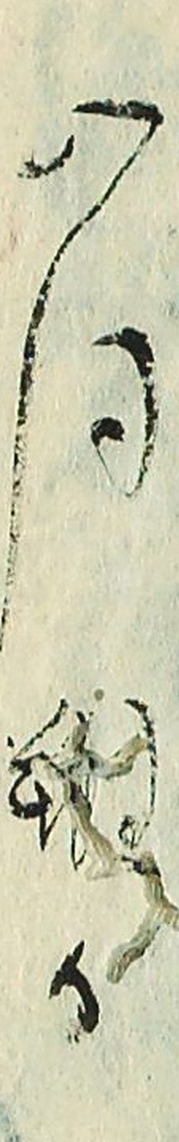八月朔日
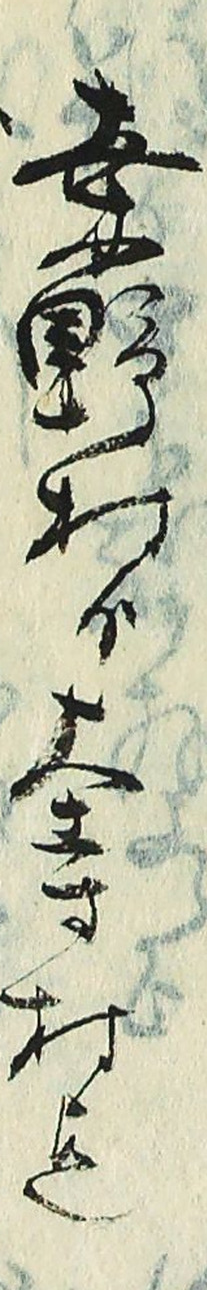桑野村ゟ大寺村迄
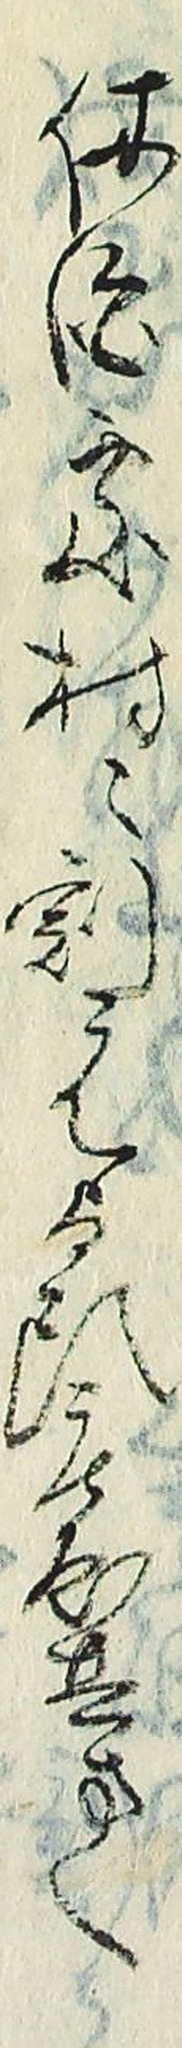休泊処村々割元与頭庄屋共方へ
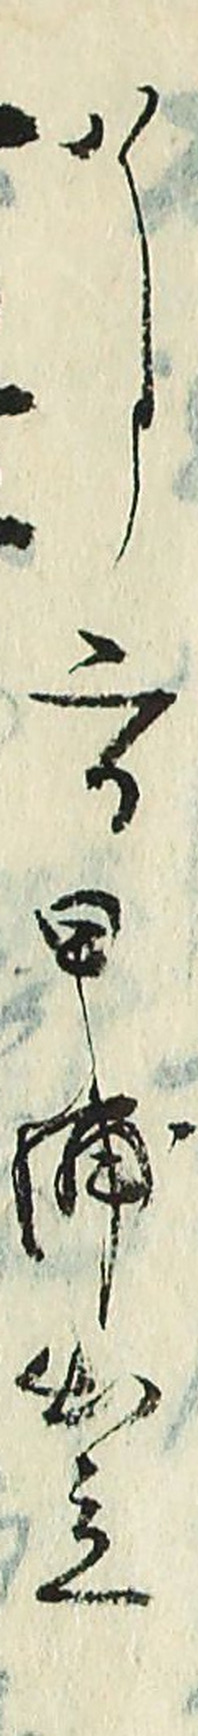八月二日甲浦出立
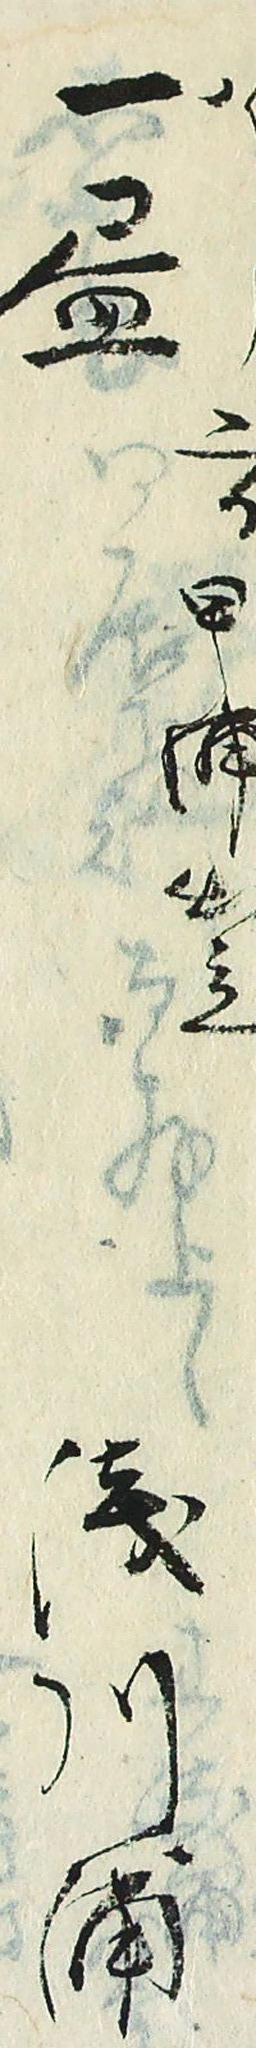一昼浅川浦
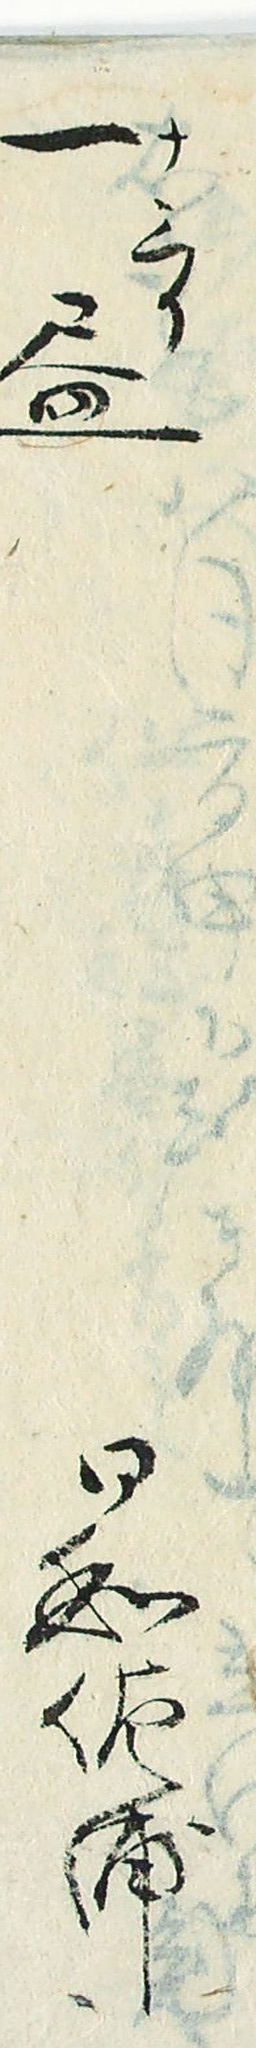一昼日和佐浦

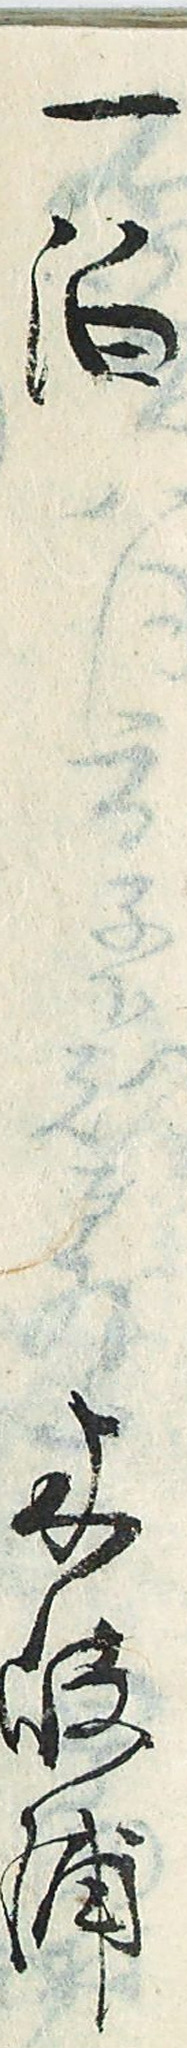一泊木岐浦
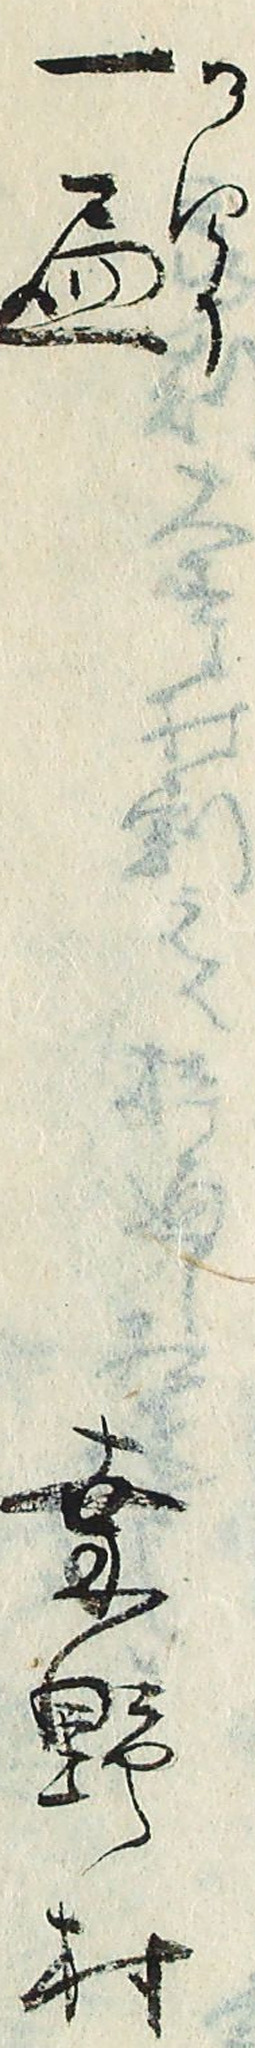一昼桑野村
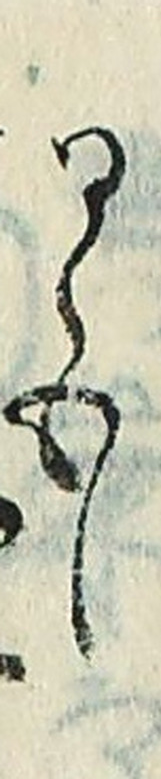同五日
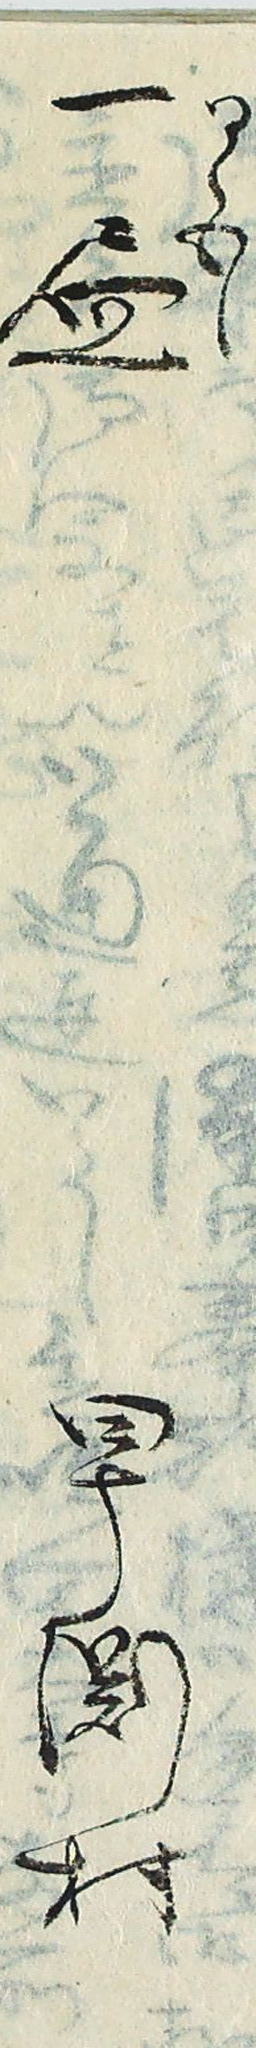一昼早淵村
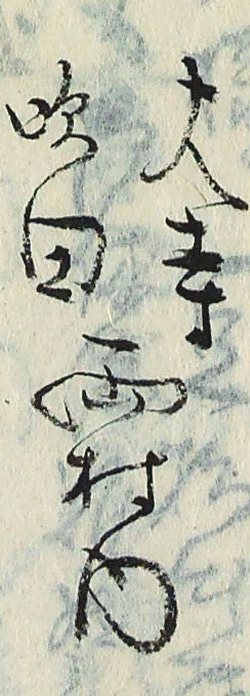吹田両村内
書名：公辺御役人為御廻浦御立越諸御用一巻
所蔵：鳴門教育大学 Naruto University of Education
